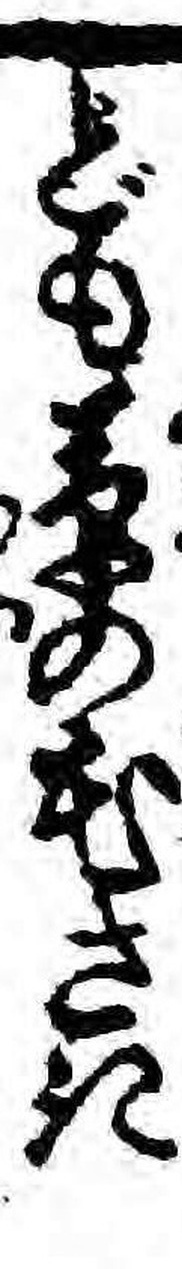ども草の花さき
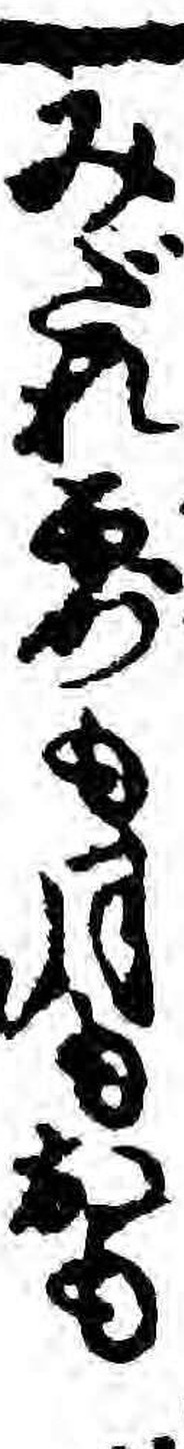みだれ露も月もおも
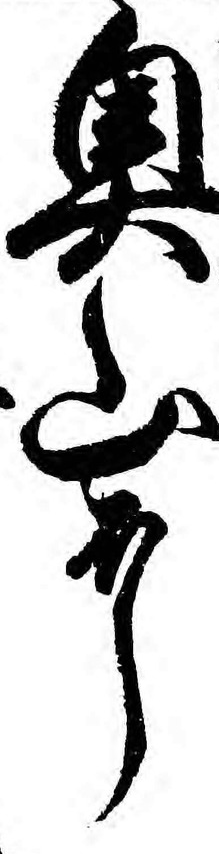奥山に
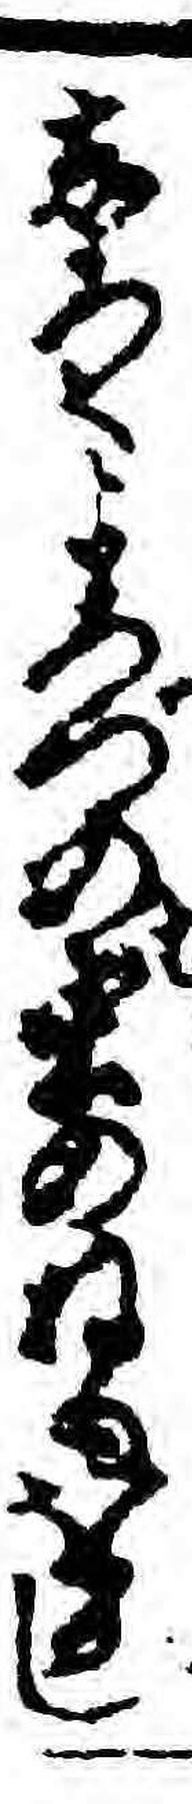しろくよろづの虫のねもをかし
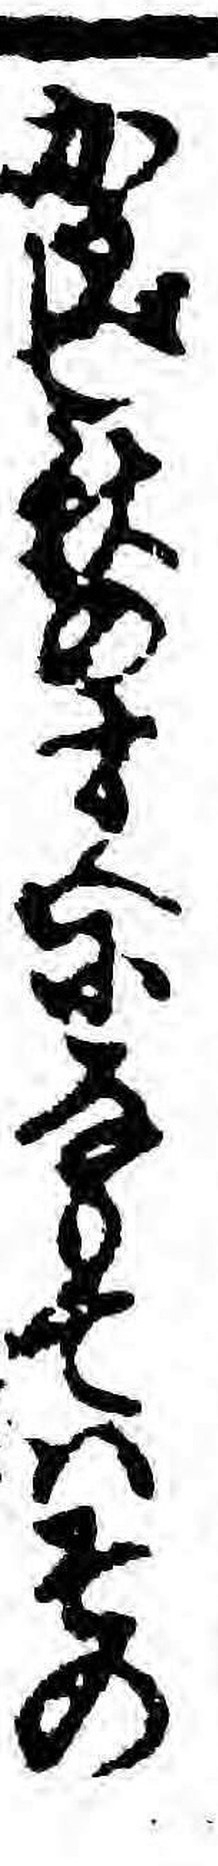かるべし秋のすへになりてはその
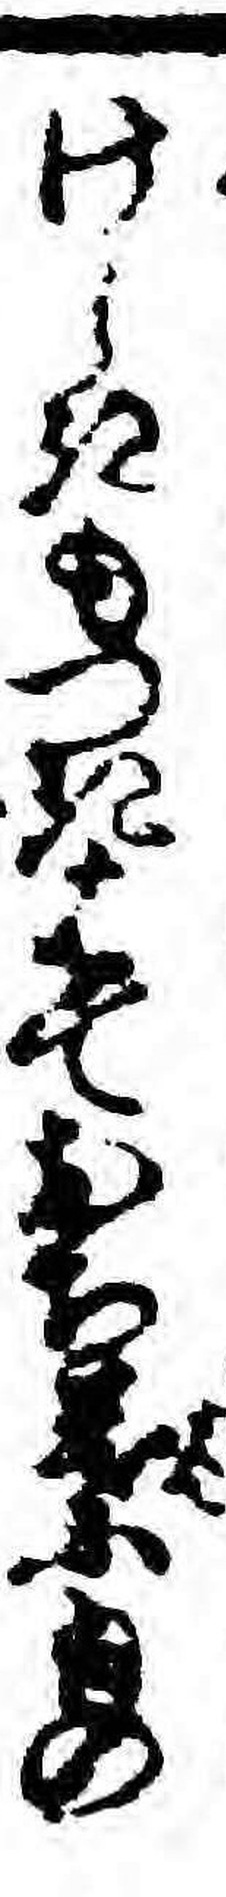けしきもつきはておち葉もの
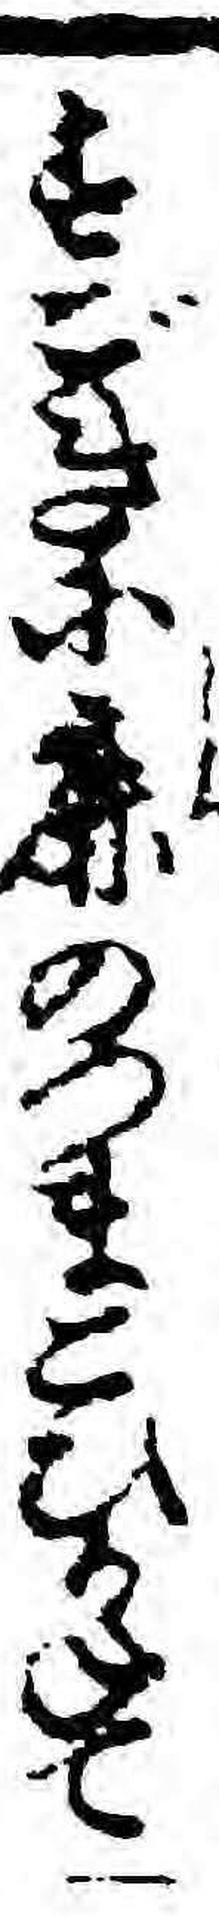すごきに鹿のつまこひかねて
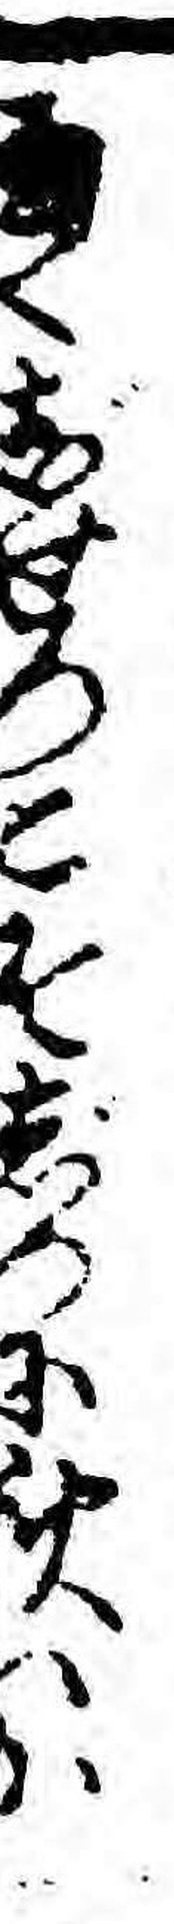なくじせつこそじつに秋はか
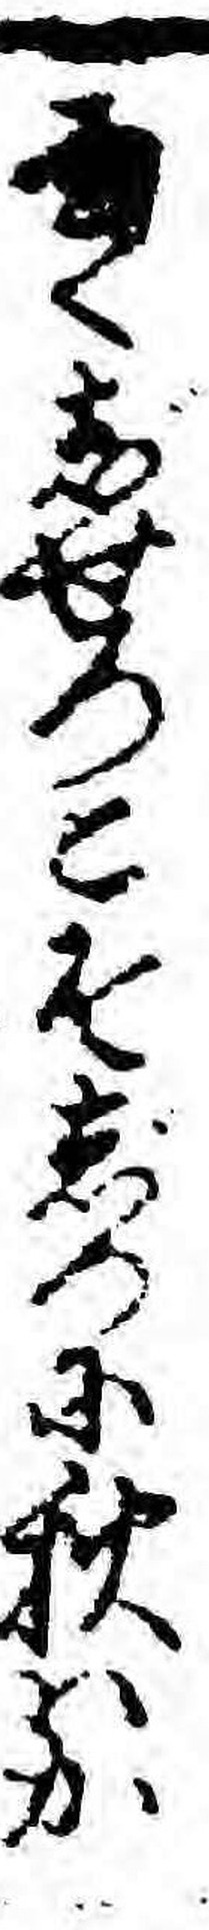なくじせつこそじつに秋はか
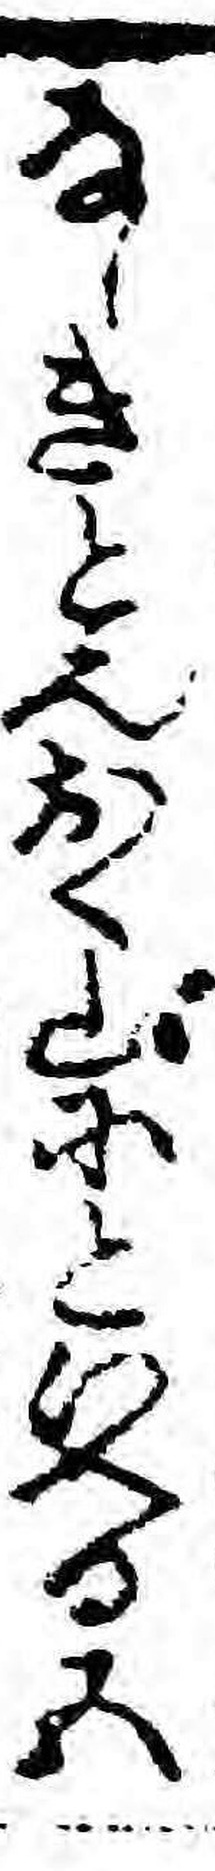なしきと也おく山にといへる五
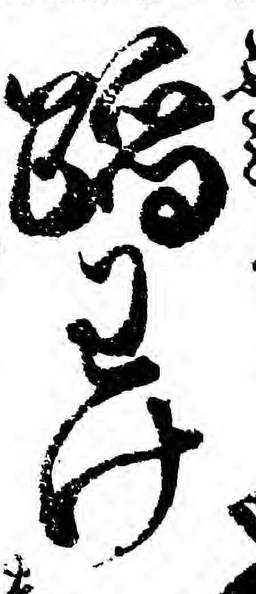踏わけ
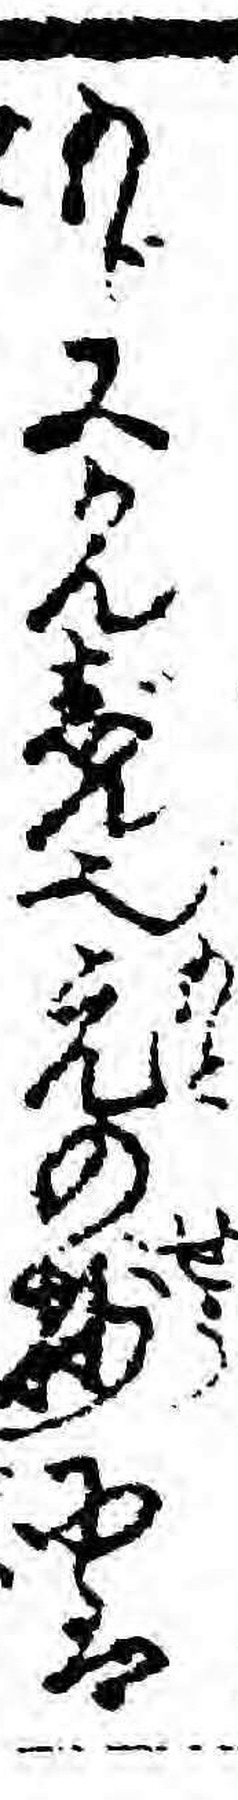もじ又かんじん也元の抄には
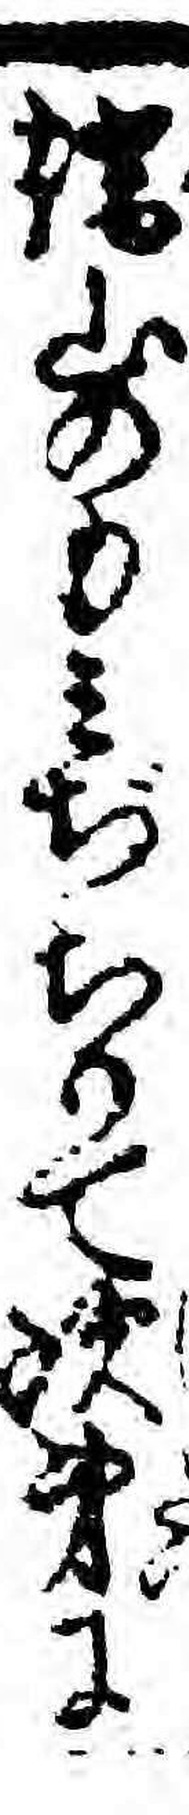端山のもみぢちりて次第に
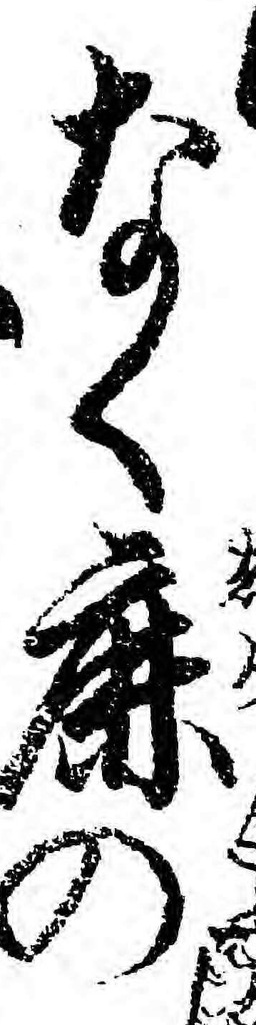なく鹿の
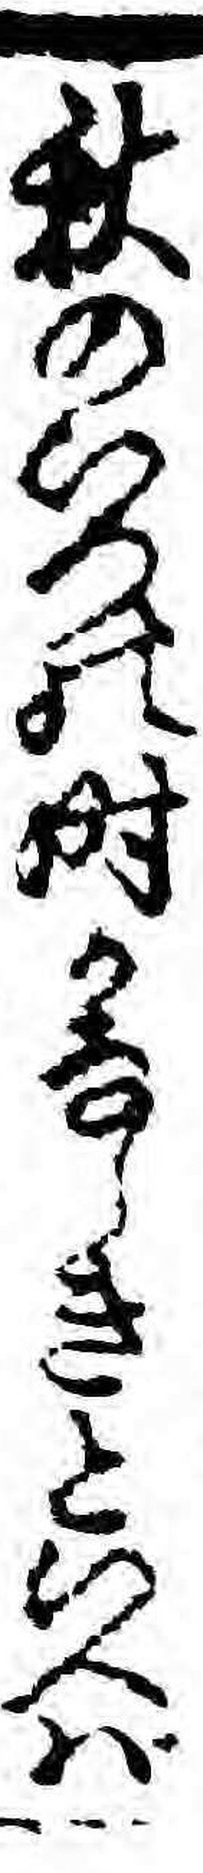秋のいつの時かなしきといへは
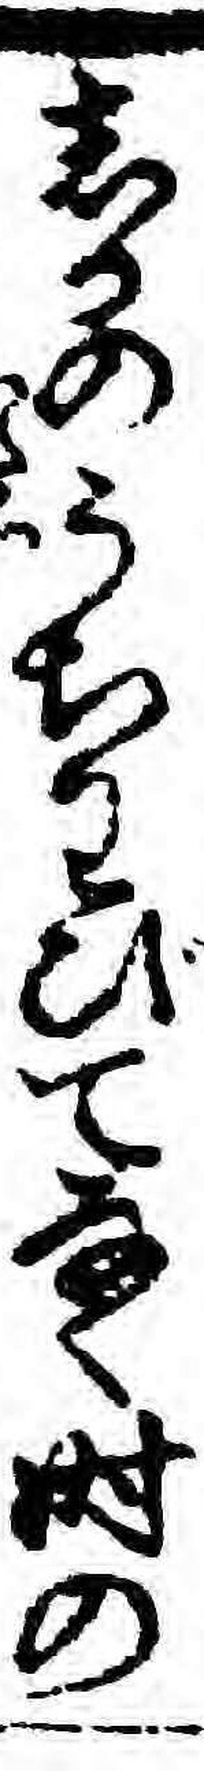しかのうちわびてなく時の
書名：頭書和歌注譯／壽賀多百人一首小倉錦
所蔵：国文学研究資料館
